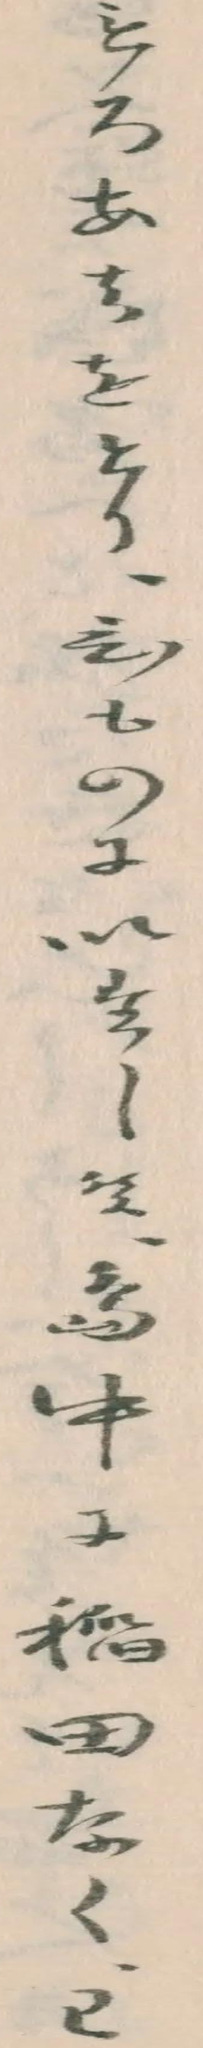もろあちをとり、ひものにいたし候、島中に稲田なく、わ
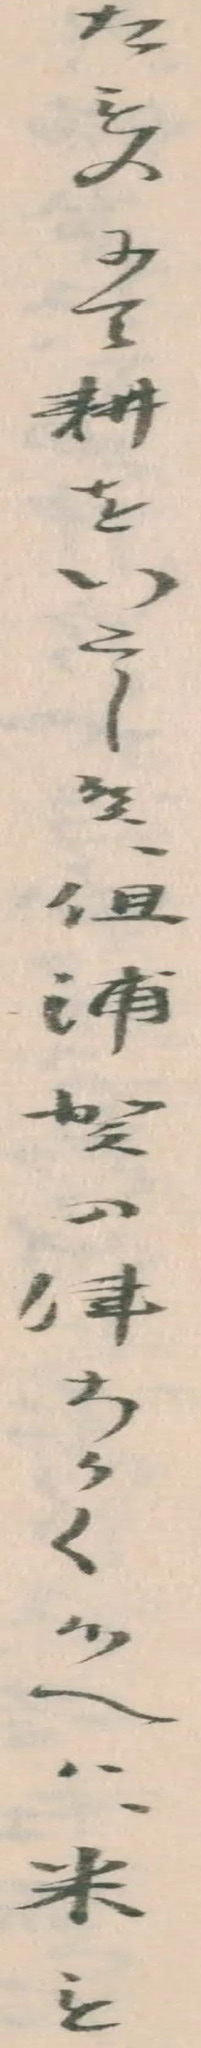たものにて耕をいたし候、但浦賀の津ちかく候へは、米も
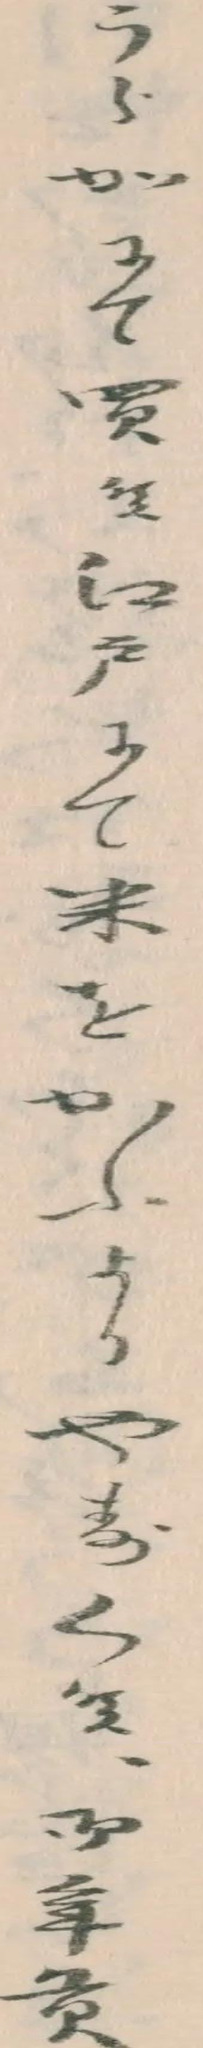うらかにて買候江戸にて米をかふよりやすく候、御年貢
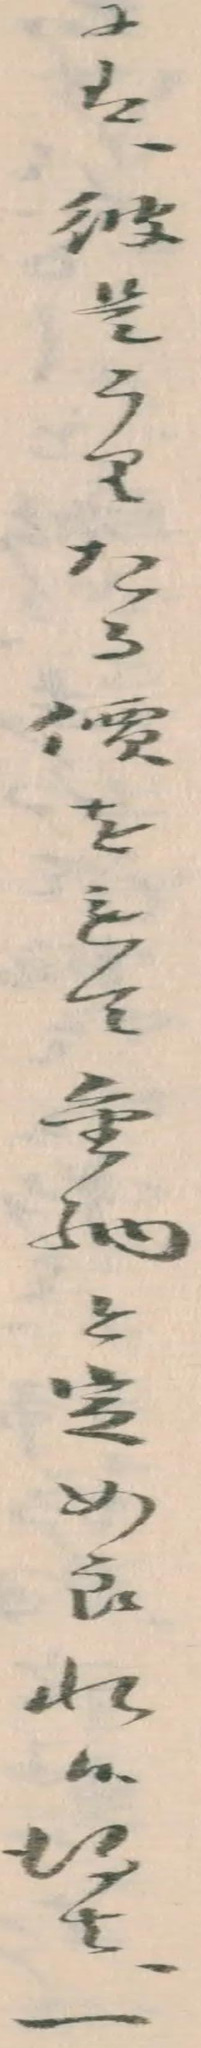には、彼是うりたる価をもて金納と定められ候得共、一
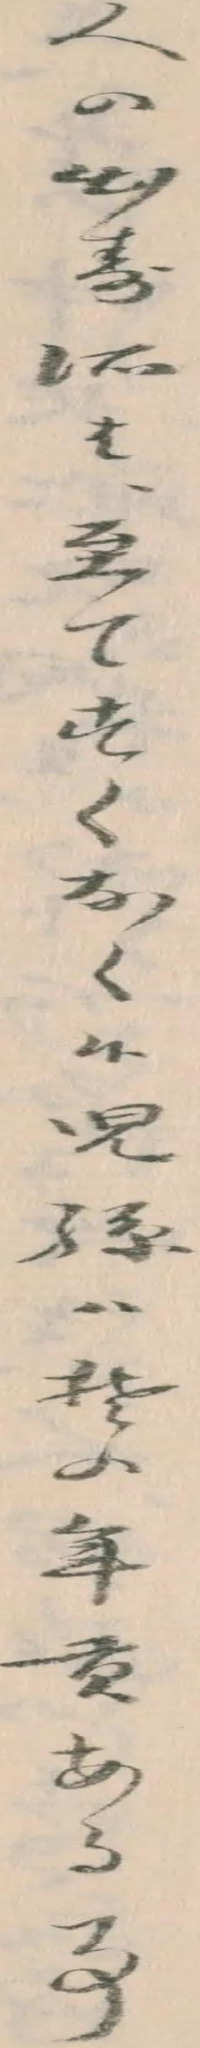人の出す所は、至てすくなく候児孫はその年貢ある事
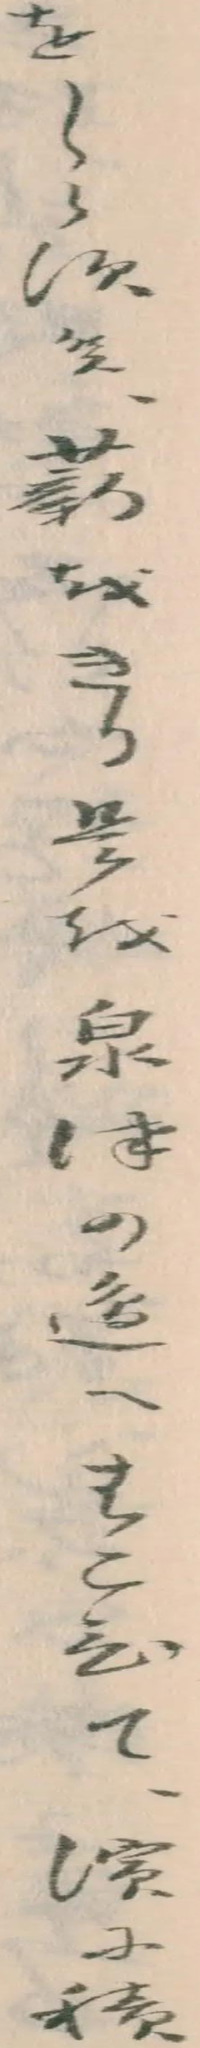をしらす候、薪をきり是を泉津の辺へはこひて、浜に積
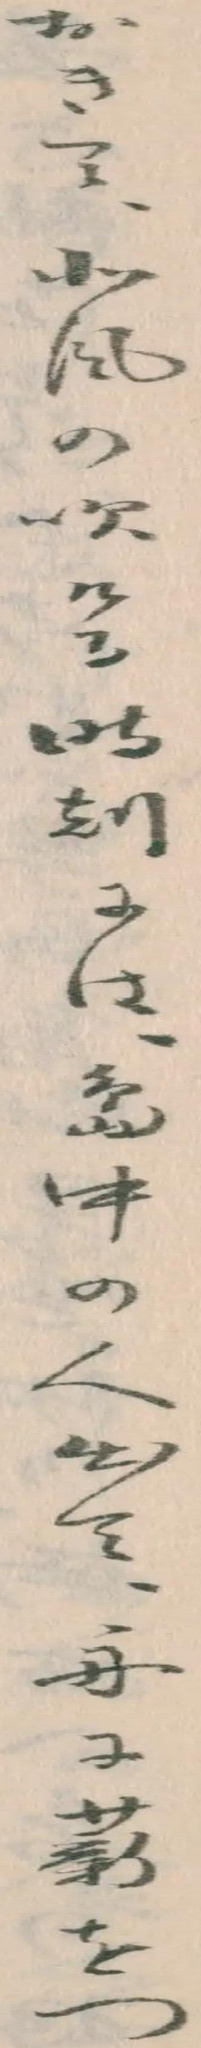おきて、北風の吹ける時刻には、島中の人出て、舟に薪をつ
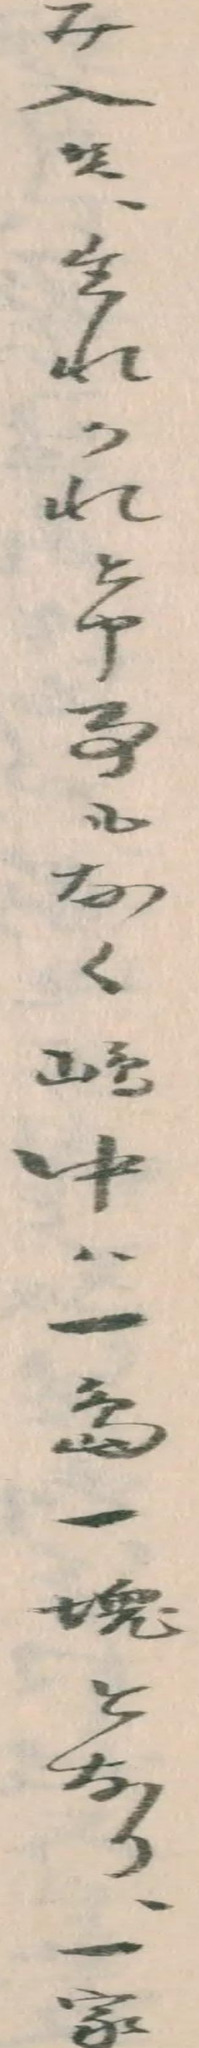み入候、たれかれと申事もなく嶋中は一島一魂となり、一家
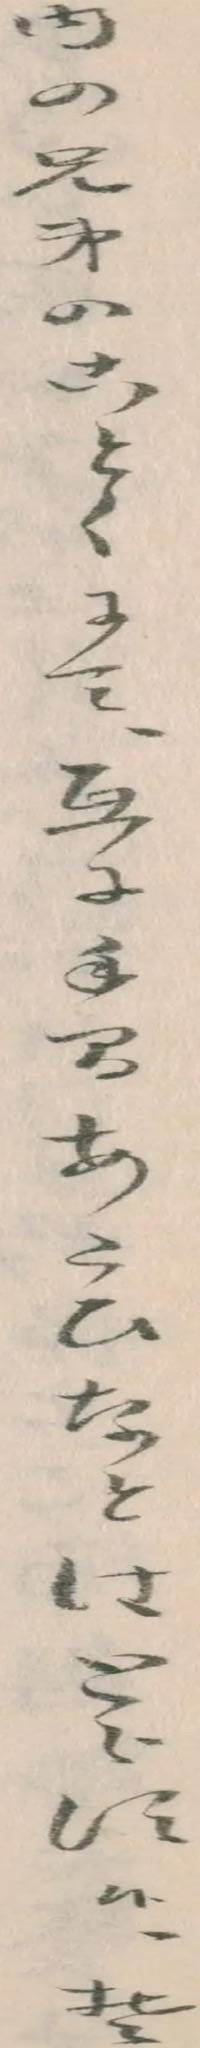内の兄弟のことくにて、互に手間あたひなとはとらす候、そ
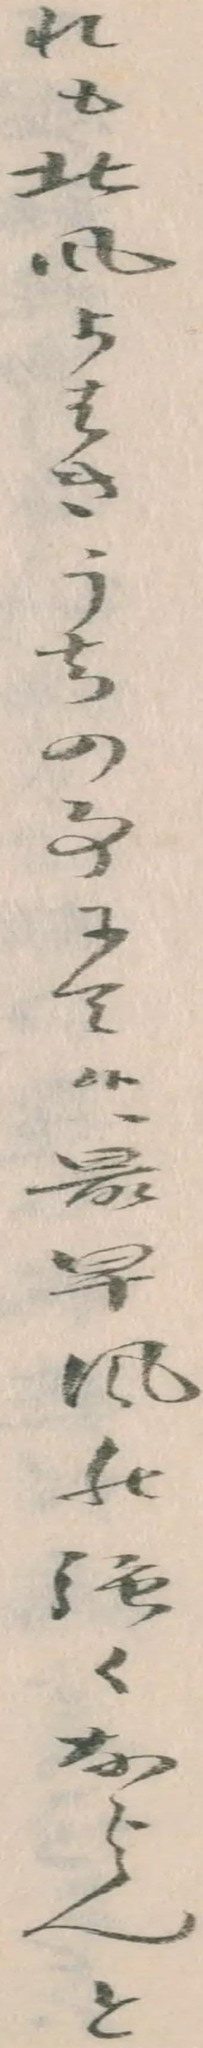れも北風よはきうちの事にて候、最早風の強くならんと
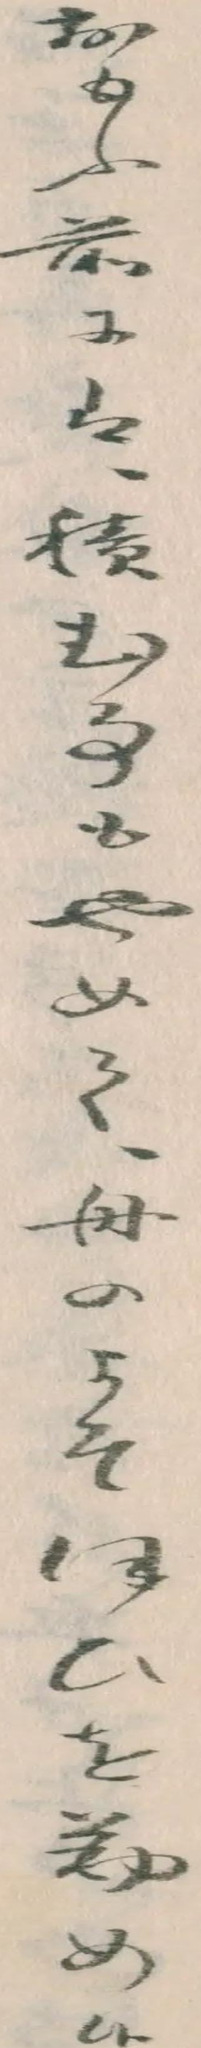おもふ前には、積む事もやめて、舟のよそほひを勤め候
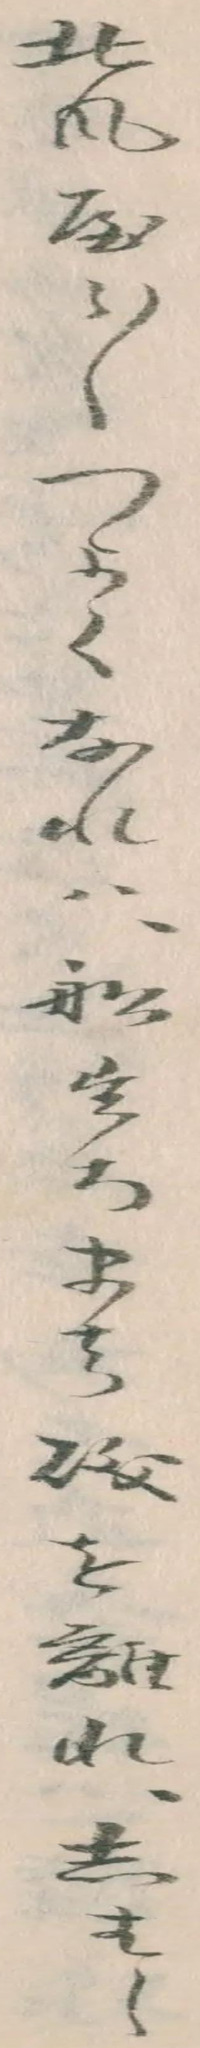北風やう〳〵つよくなれは、船たちまち磯を離れ、しはし
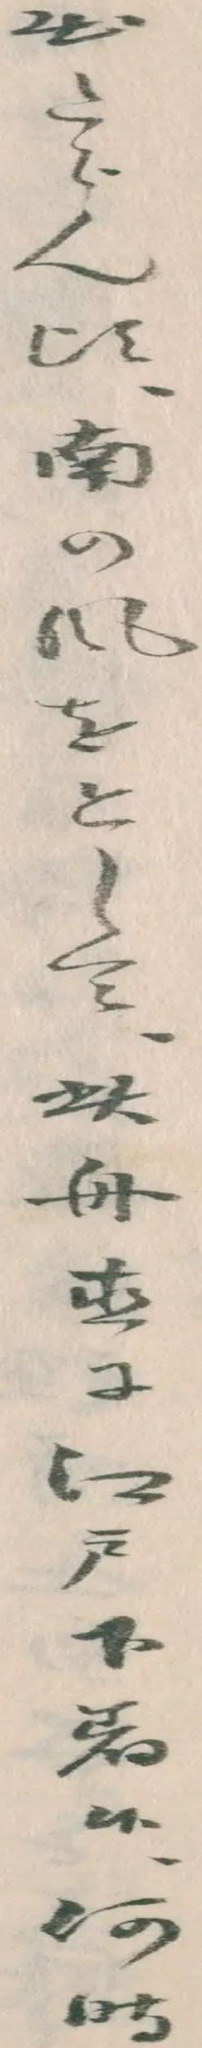出たらん頃、南の風をとして、此舟直に江戸下着候、何時
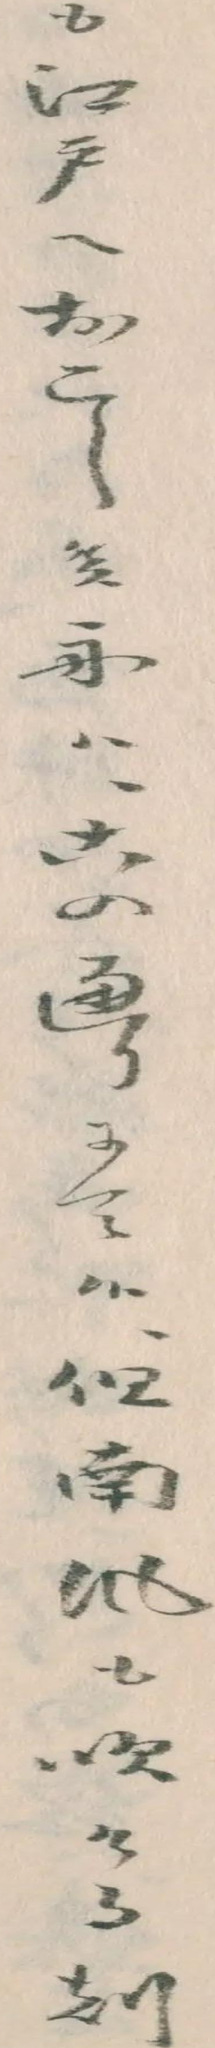も江戸へおこし候舟は、この通りにて候、但南風も吹ける刻
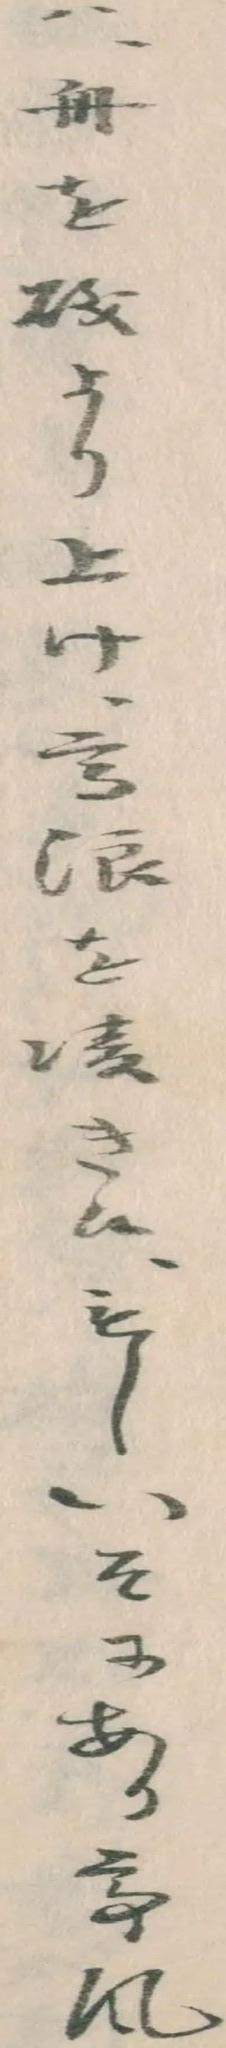は、舟を磯より上け、高浪を凌き候、もしいそにありて風

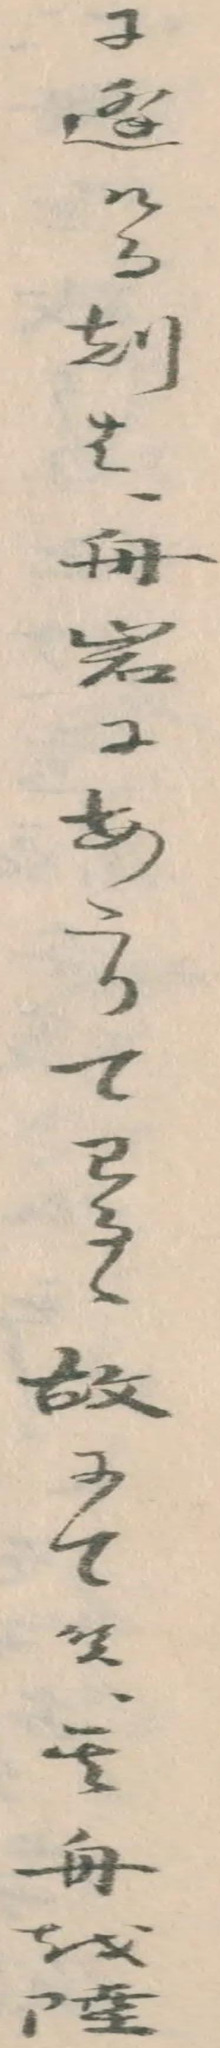に逢ける刻は、舟岩にあたりてわるゝ故にて候、其舟を陸
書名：地災撮要. 巻11-12(地震之部)
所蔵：国立国会図書館 National Diet Library, JAPAN
